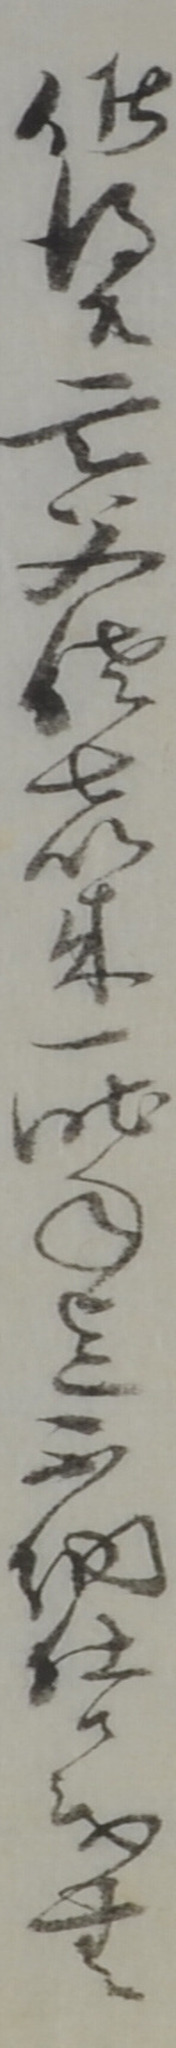候得共亡父佐七以来一昨年迄不納仕候義無
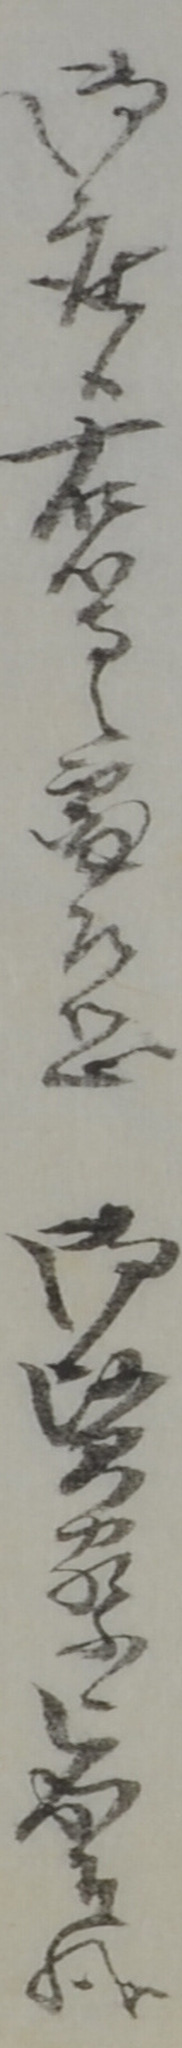御座候右等之処乍恐御賢察被成下候様
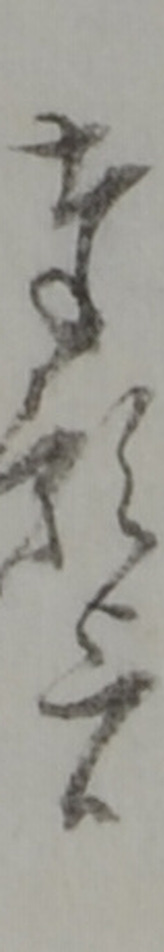奉願上候
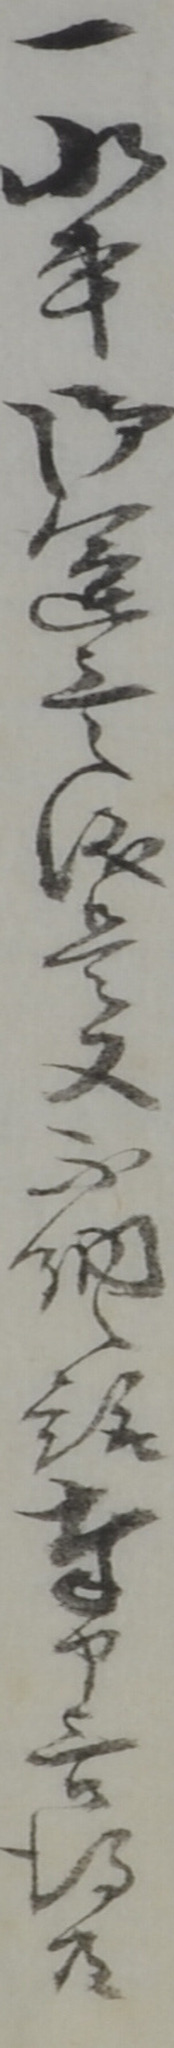一水車御運上之儀是又不納之趣奉申上候得共
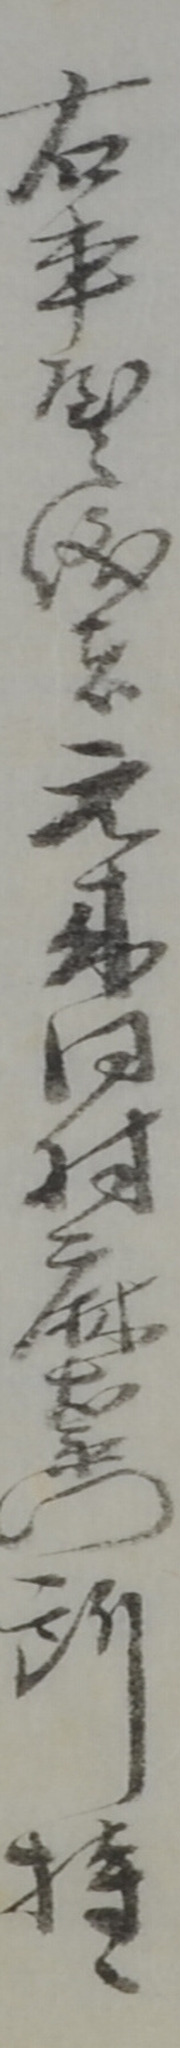右車屋之儀者元来同村麻右衛門所持候へ
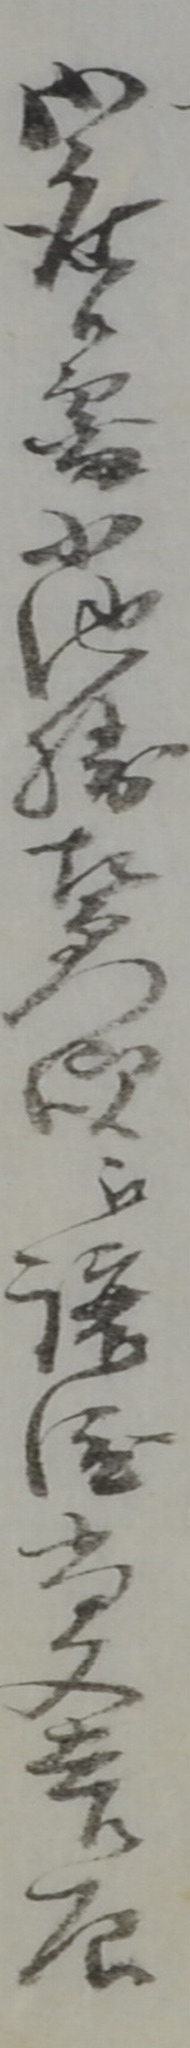御座候処小池勝左衛門様え譲渡尚又去ル辰
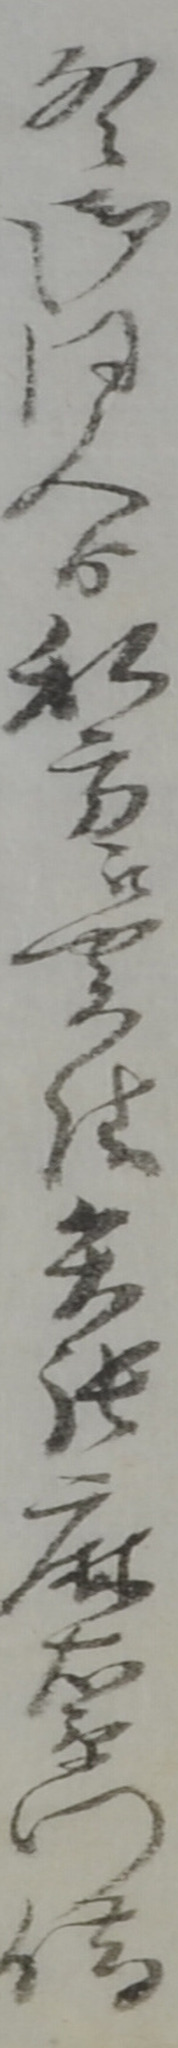冬御同人より私方え買矢張麻右衛門借
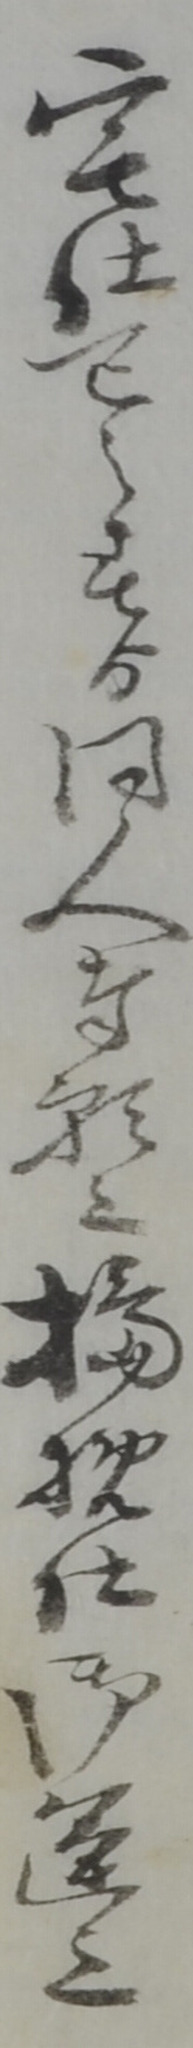宅仕巳之春より同人奉願上搗挽仕御運上

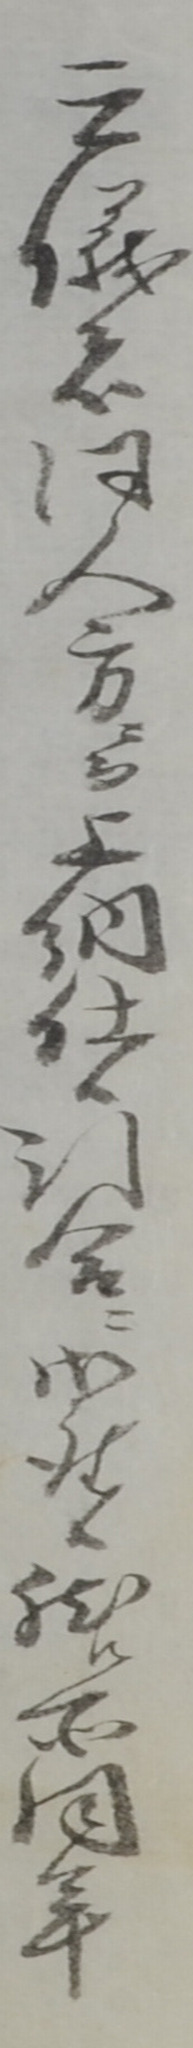之儀者同人方ニ而上納仕候引合ニ御座候然ル所同年
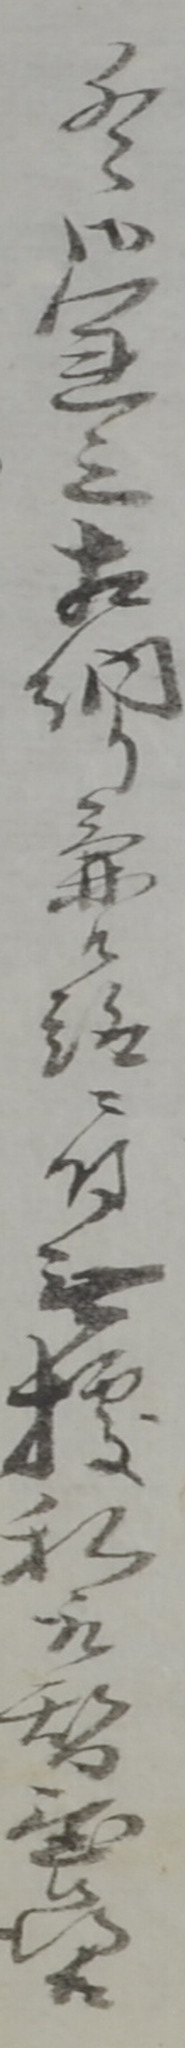冬御運上相納り兼候趣ニ付無拠私取替置候得共
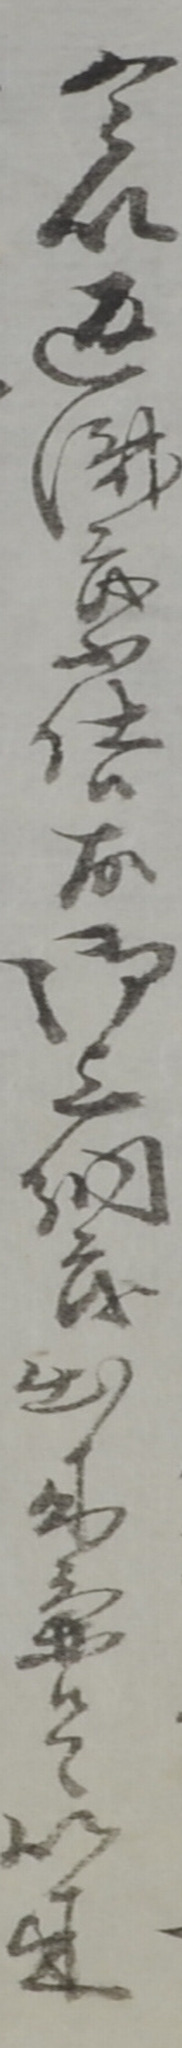今以返済も不仕候故御上納も出来兼候ハヽ以来
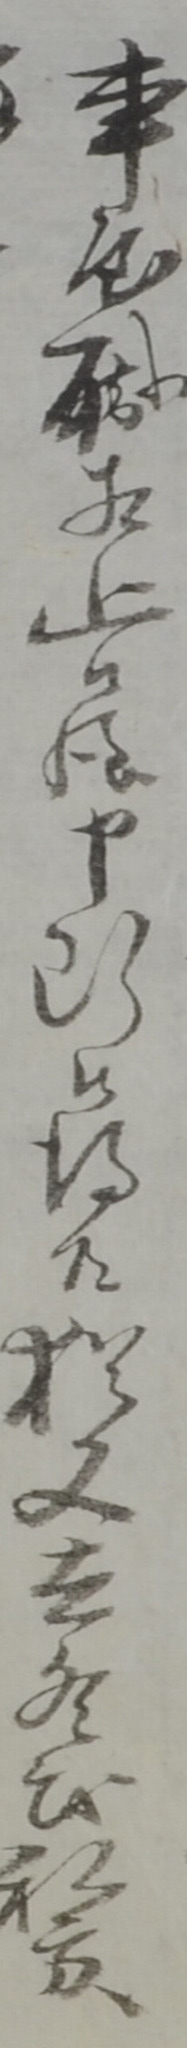車屋職相止候様申断候得共猶又去冬も私方へ
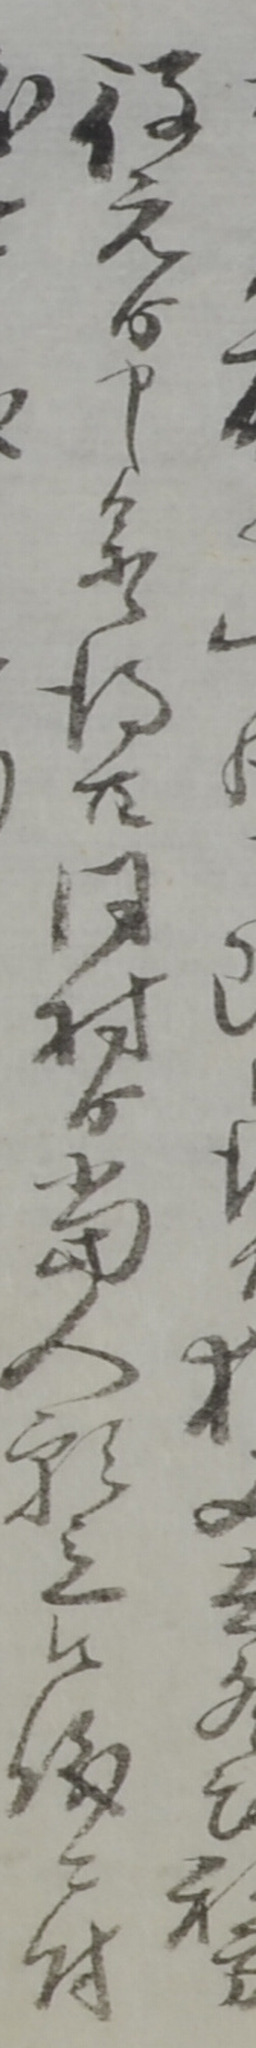役元より申参候得共同村より当人願上候儀ニ付
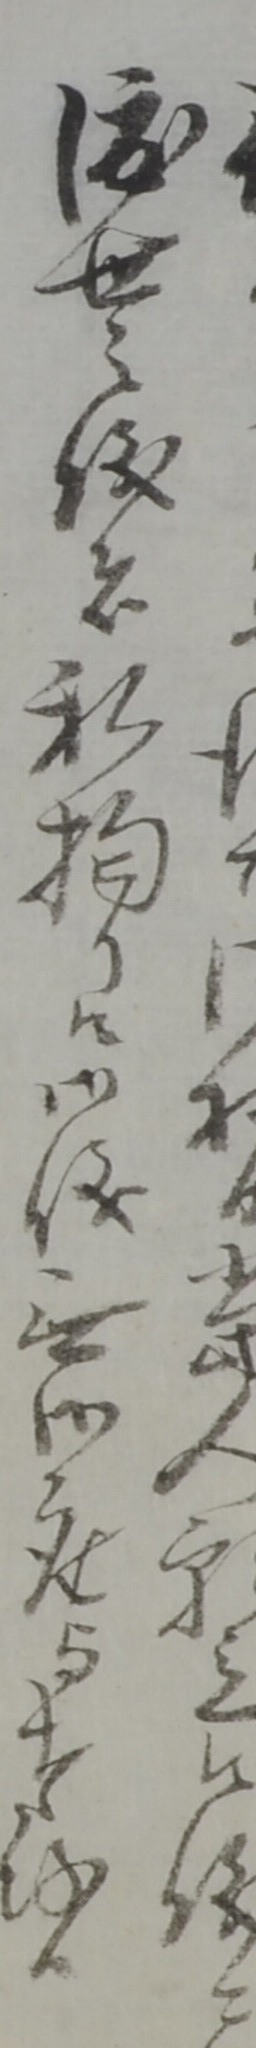渡世之儀者私拘り候御儀無御座と奉存候
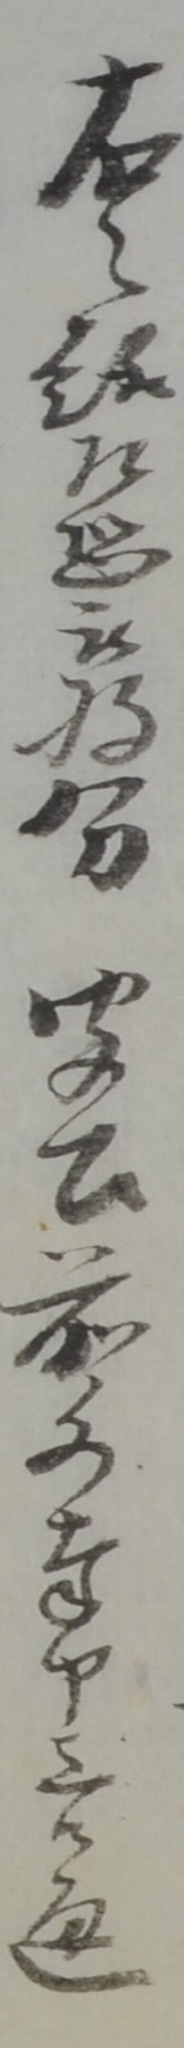右之趣乍恐被為分聞召前文奉申上候通
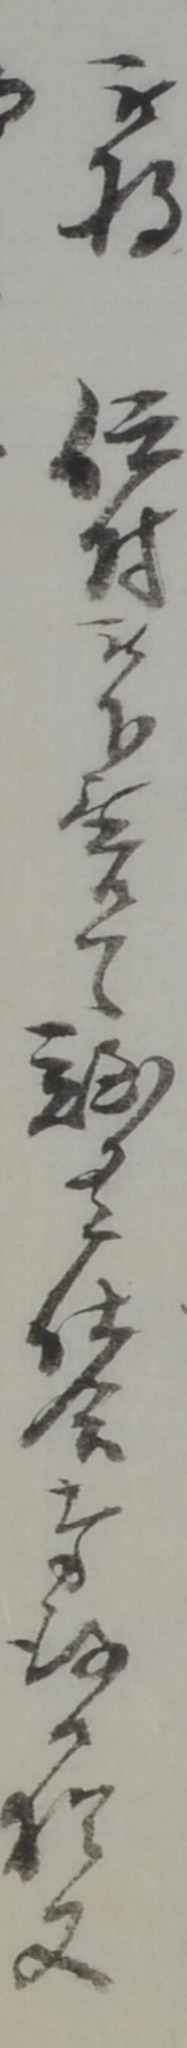被為仰付被下置候ハヽ難有仕合奉存候猶又
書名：諸願書控帳
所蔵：伊那市立高遠町図書館・合同会社AMANE
